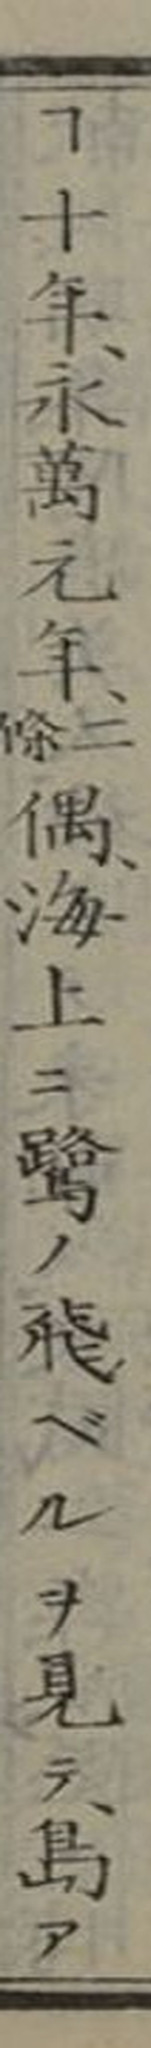ヿ十年、永万元年、二条偶、海上ニ鷺ノ飛ベルヲ見テ、島ア
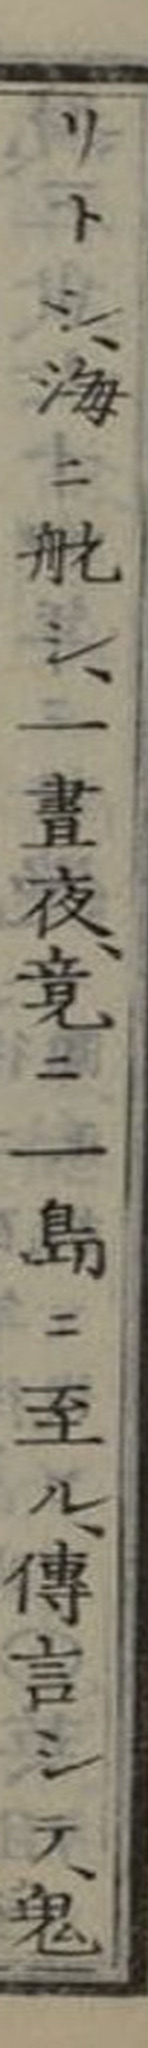リトシ、海ニ航シ、一昼夜、竟ニ一島ニ至ル、伝言シテ、鬼
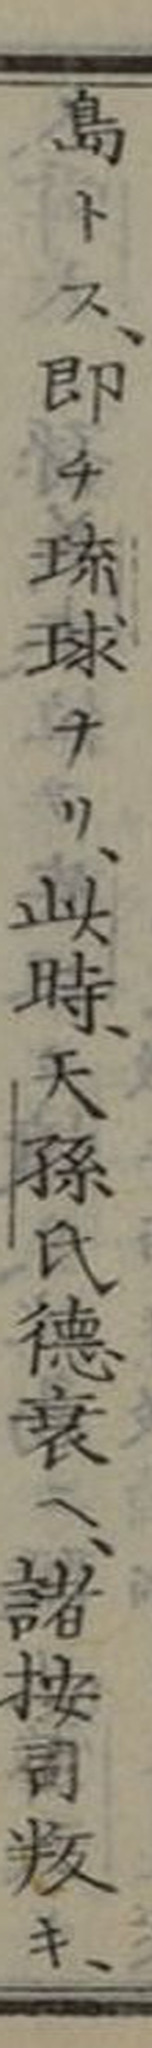島トス、即チ琉球ナリ、此時、天孫氏徳衰ヘ、諸按司叛キ、
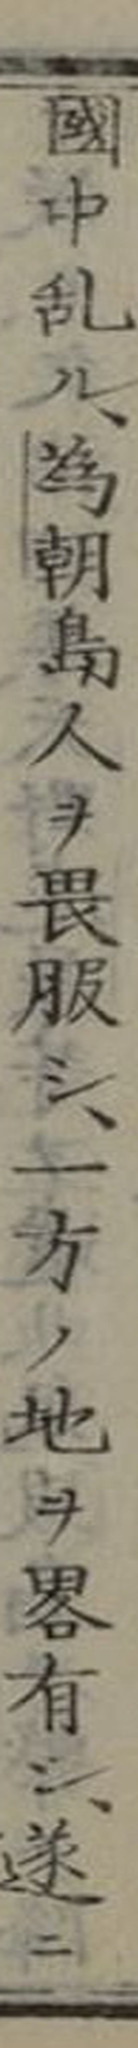国中乱ル、為朝島人ヲ畏服シ、一方ノ地ヲ略有シ、遂ニ
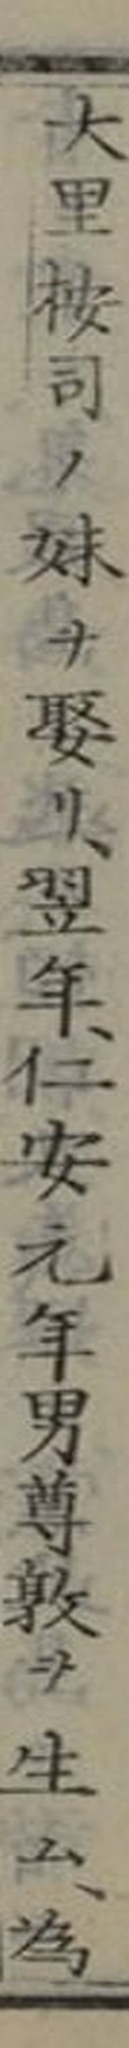大里按司ノ妹ヲ娶リ、翌年、仁安元年男尊敦ヲ生ム、為
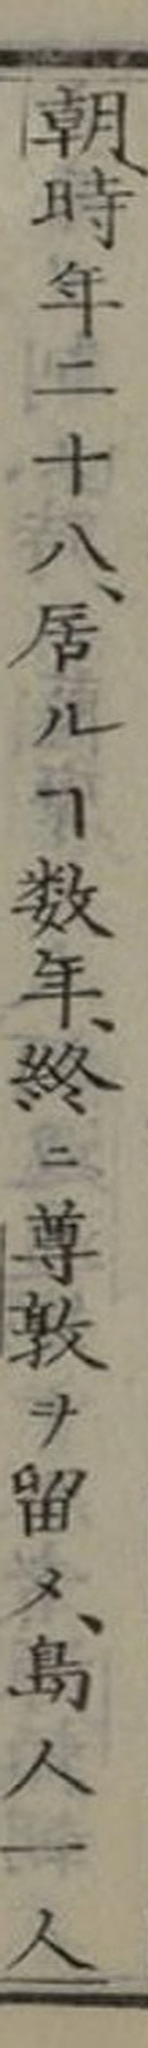朝、時年二十八、居ルヿ数年、終ニ尊敦ヲ留メ、島人一人
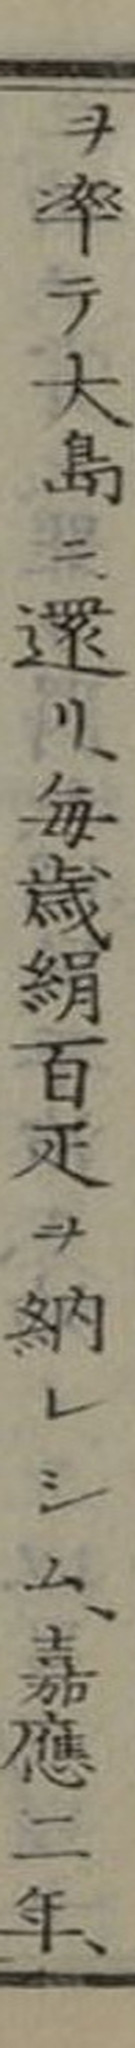ヲ率テ大島ニ還リ、毎歳絹百疋ヲ納レシム、嘉応二年、
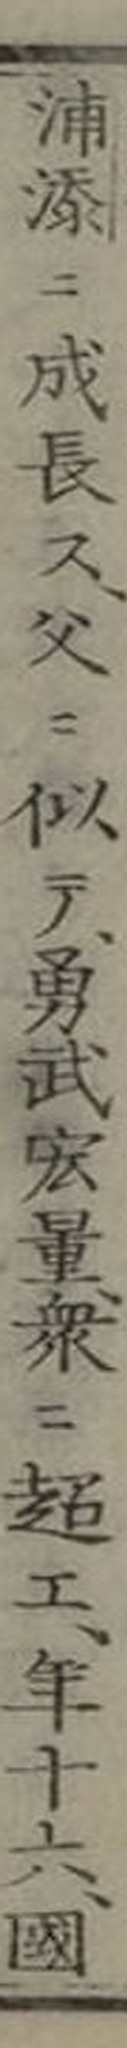浦添ニ成長ス、父ニ似テ、勇武宏量、衆ニ超エ、年十六、国
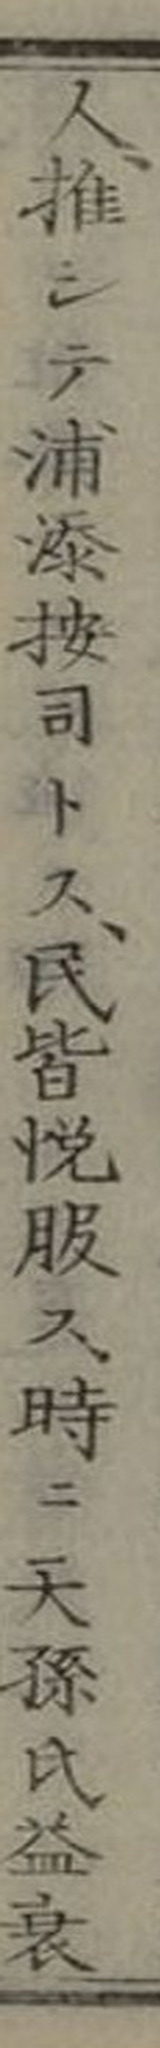人、推シテ、浦添按司トス、民皆悦服ス、時ニ天孫氏益衰
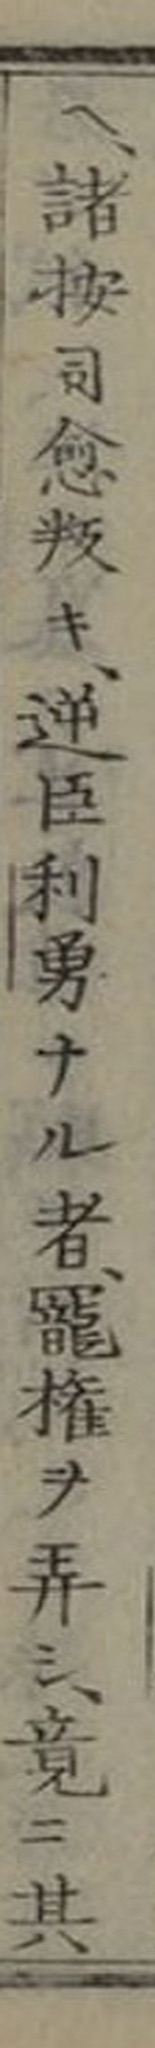ヘ、諸按司愈叛キ、逆臣利勇ナル者、寵権ヲ弄シ、竟ニ其

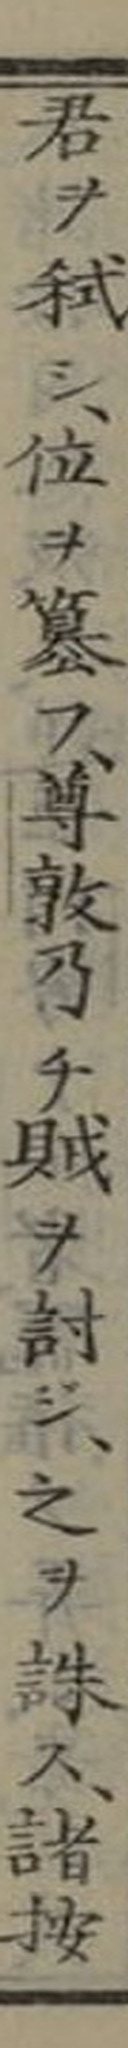君ヲ弑シ、位ヲ簒フ、尊敦乃チ賊ヲ討ジ、之ヲ誅ス、諸按
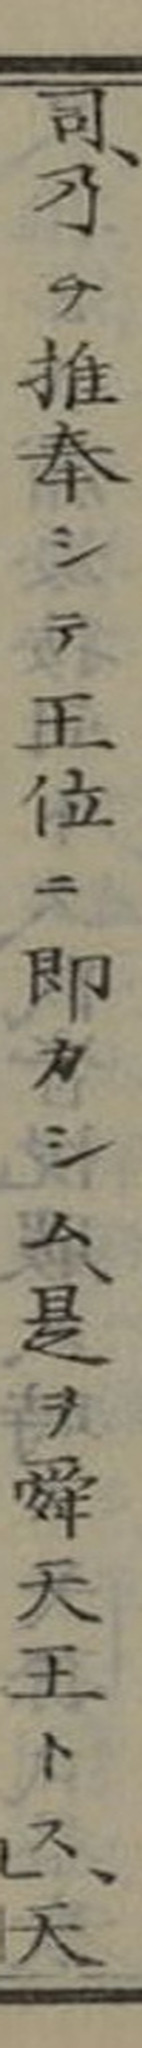司、乃チ推奉シテ王位ニ即カシム、是ヲ舜天王トス、」天
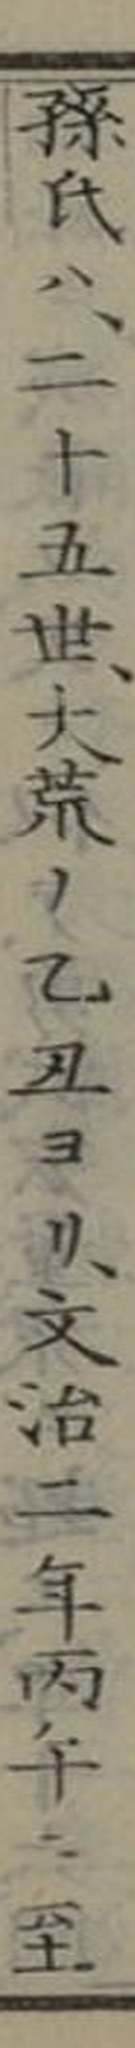孫氏ハ、二十五世、大荒ノ乙丑ヨリ、文治二年丙午ニ至
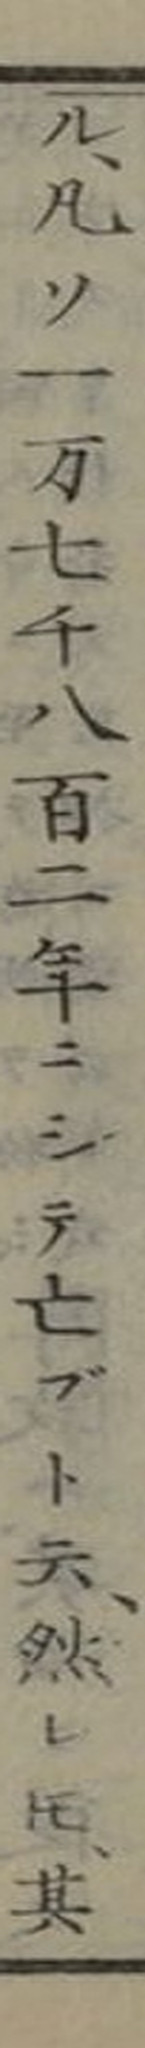ル、凡ソ一万七千八百二年ニシテ亡ブト云、然レトモ、其
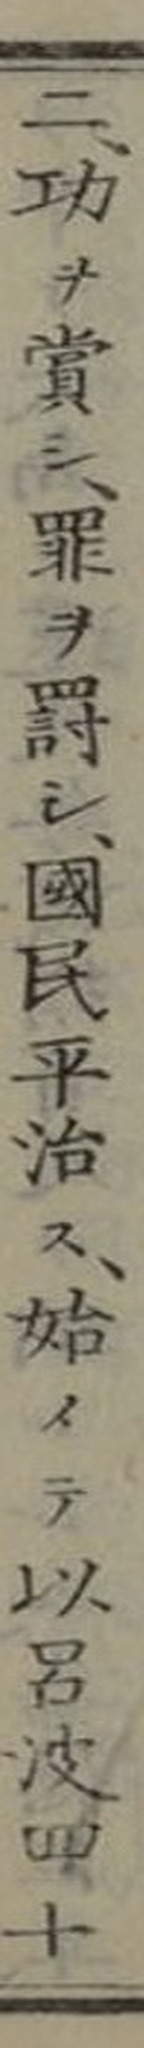二、功ヲ賞シ、罪ヲ罸シ、国民平治ス、始メテ以呂波四十
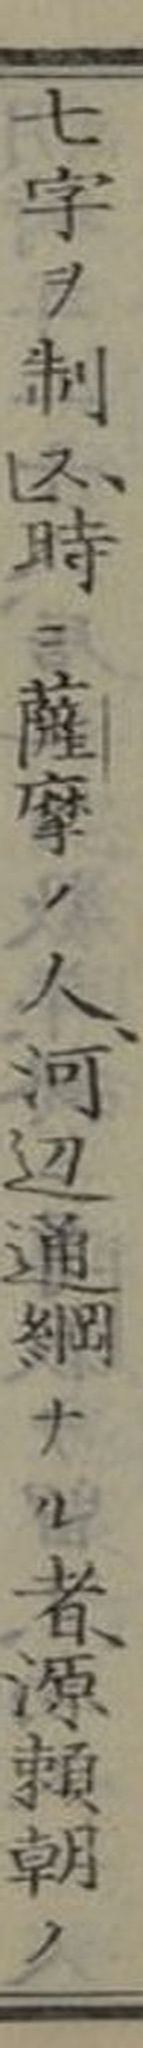七字ヲ制ス、」時ニ薩摩ノ人、河辺通綱ナル者、源頼朝ノ
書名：琉球新誌 図附 上
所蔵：University of the Ryukyus Library
